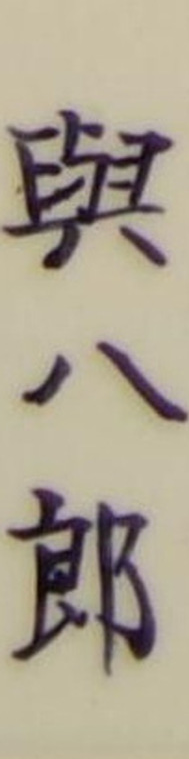与八郎

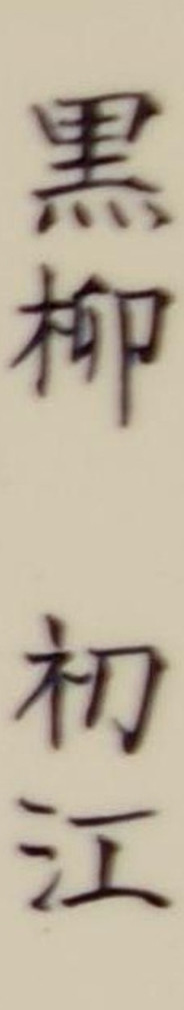黒柳初江
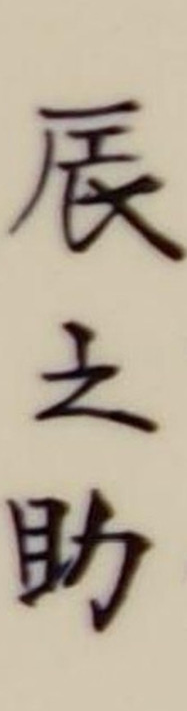辰之助
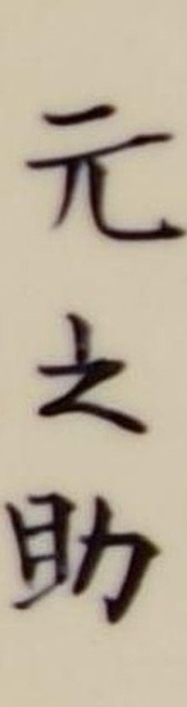元之助
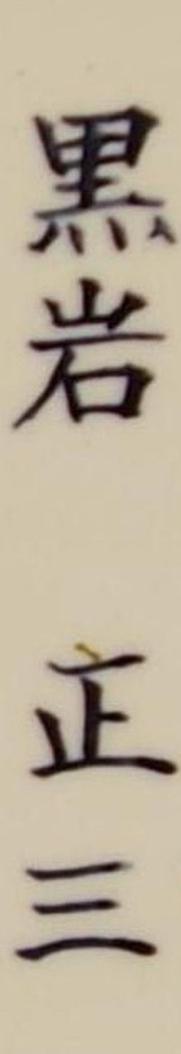黒岩正三
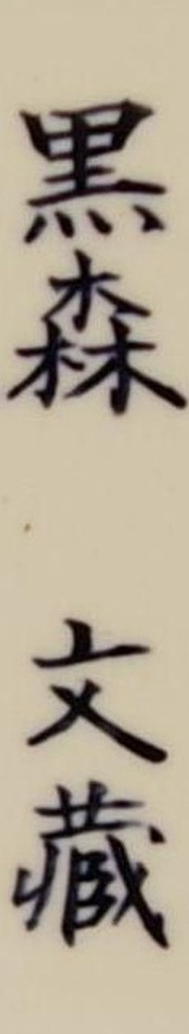黒森文蔵
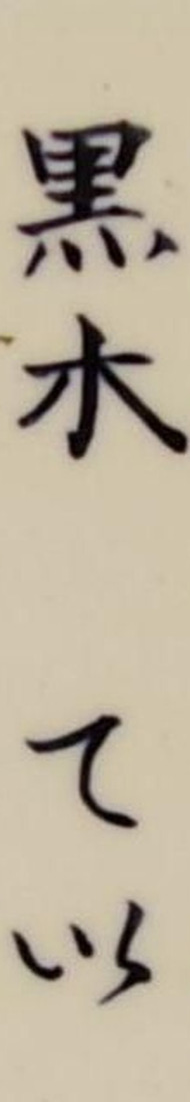黒木てい
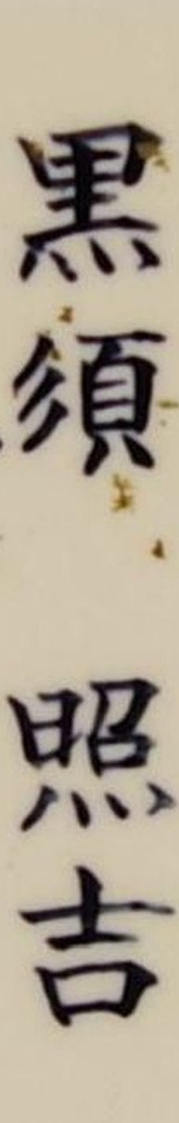黒須照吉
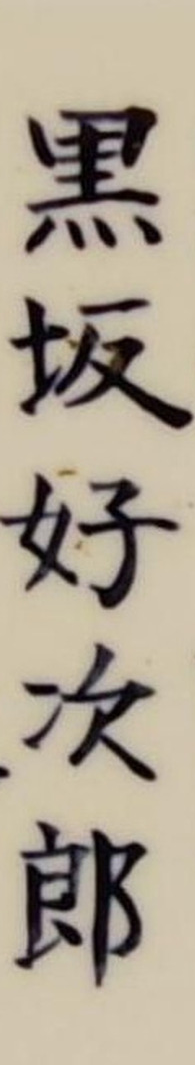黒坂好次郎
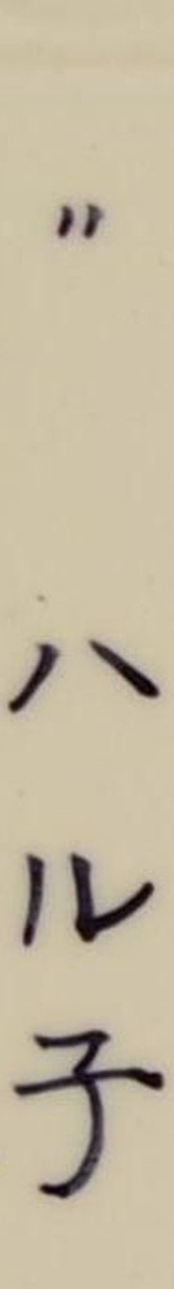ハル子
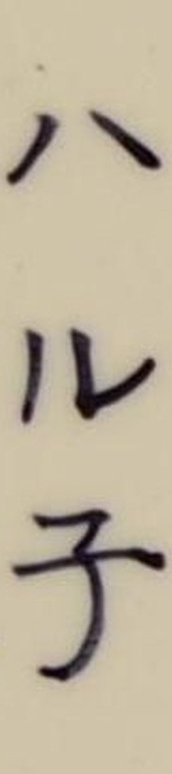ハル子
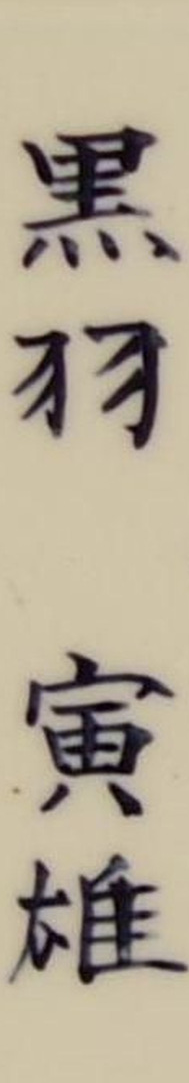黒羽寅雄
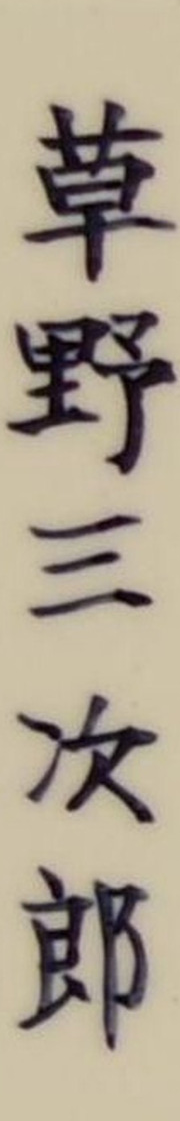草野三次郎
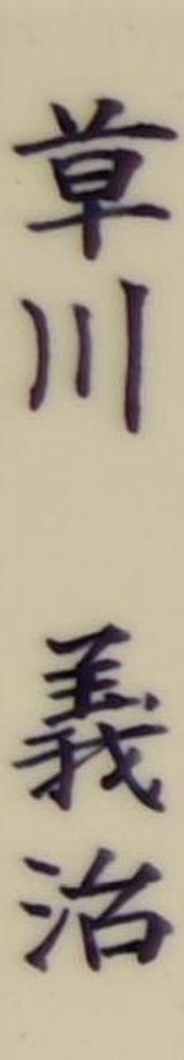草川義治

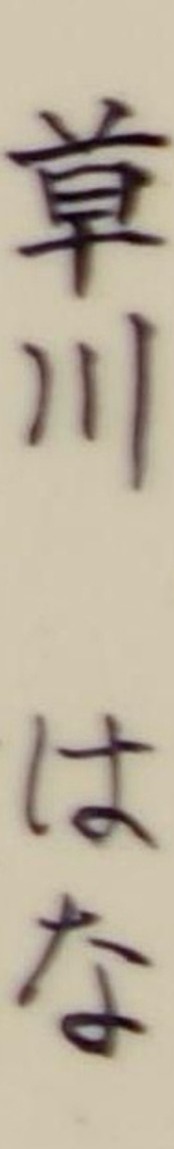草川はな
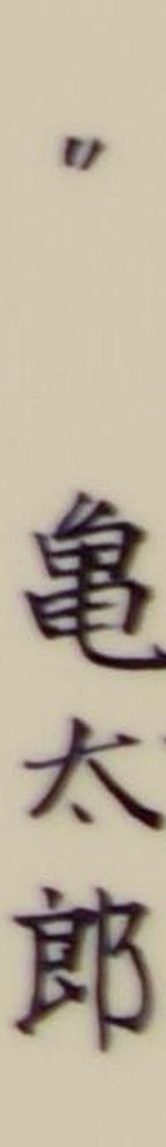亀太郎
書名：A~D
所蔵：koyasan kongobuji
